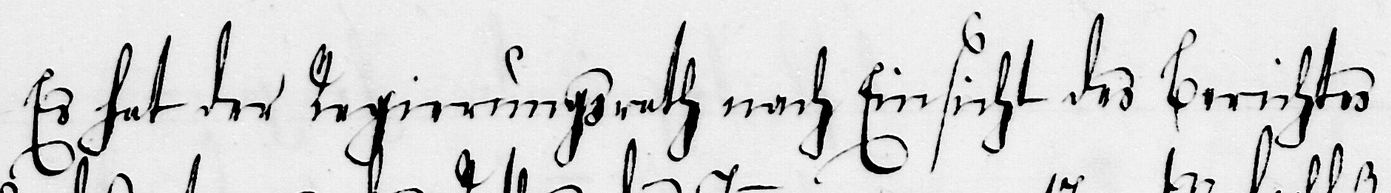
Es hat der Regierungsrath nach Einsicht des Berichtes
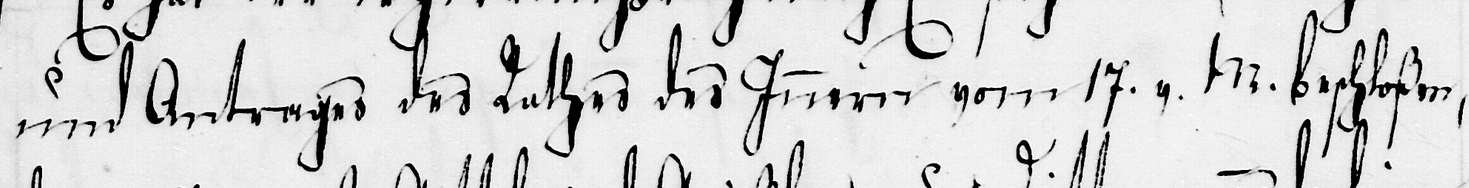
und Antrages des Rathes des Innern vom 17. v. M. beschloße¬
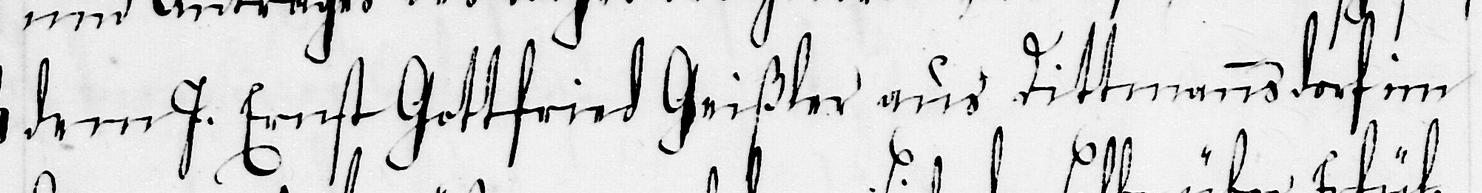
dem J. Ernst Gottfried Geißler aus Dittmannsdorf im
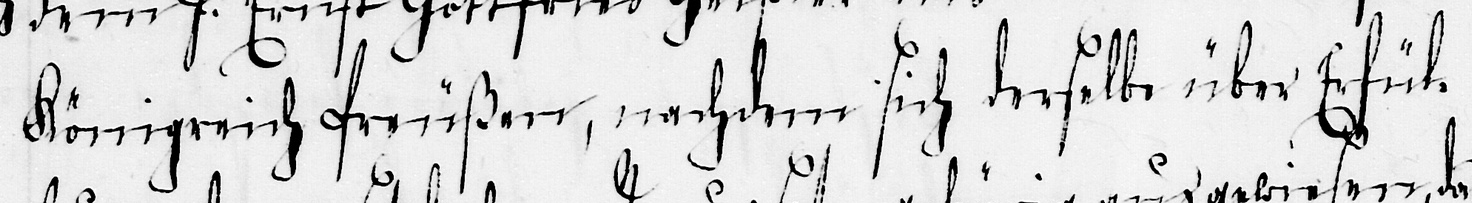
Königreich Preußen, nachdem sich derselbe über Erfül¬
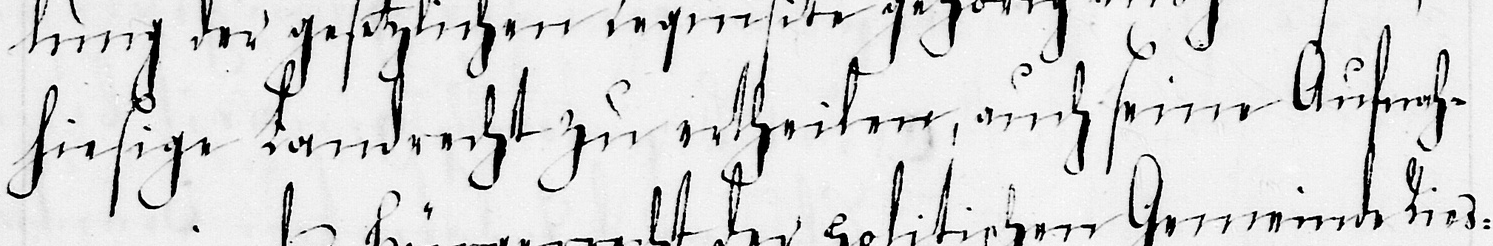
hiesige Landrecht zu ertheilen, auch seine Aufnah¬
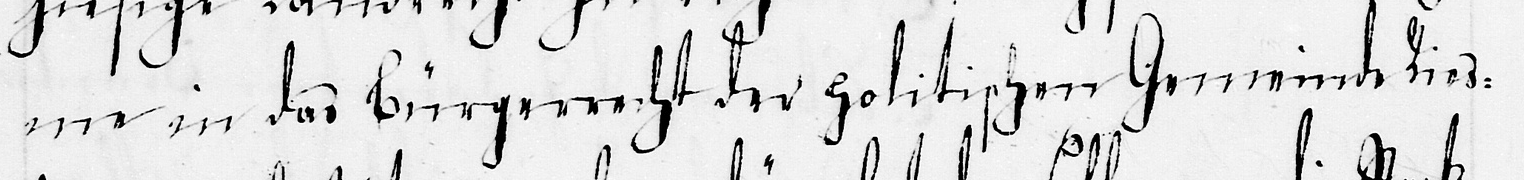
me in das Bürgerrecht der politischen Gemeinde Ries¬
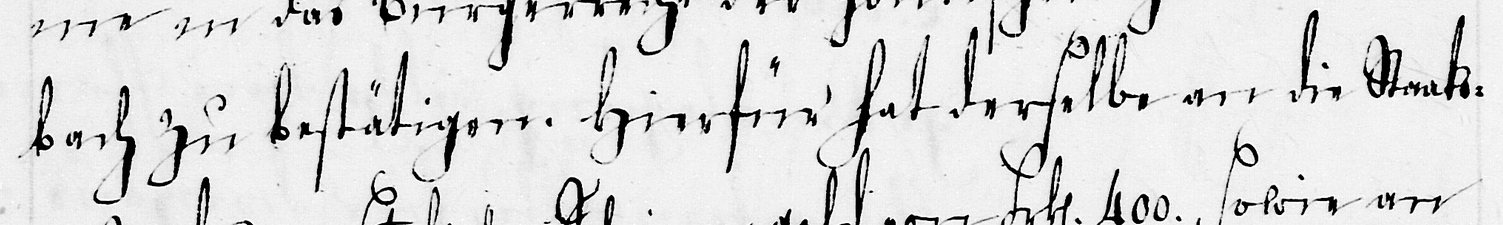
bach zu bestätigen. Hierfür hat derselbe an die Staa¬
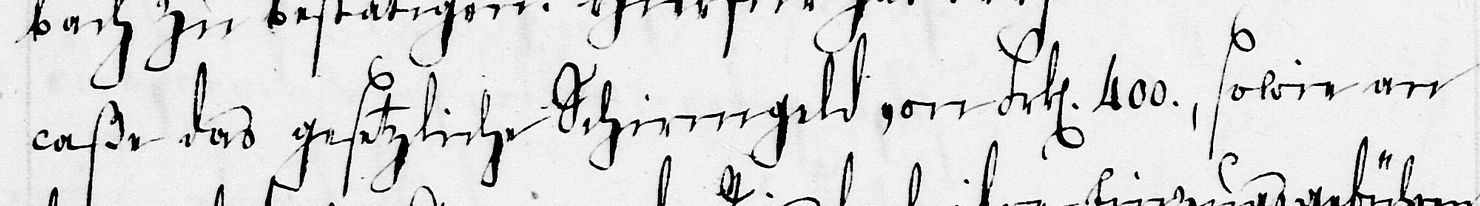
caße das gesetzliche Schirmgeld von Frk[en]. 400., sowie an
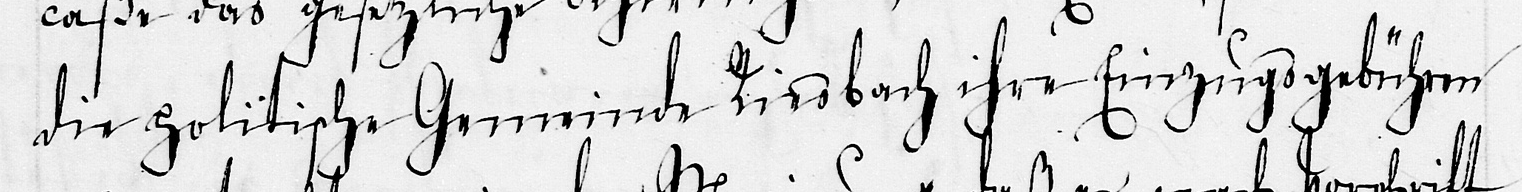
die politische Gemeinde Riesbach ihre Einzugsgebühren
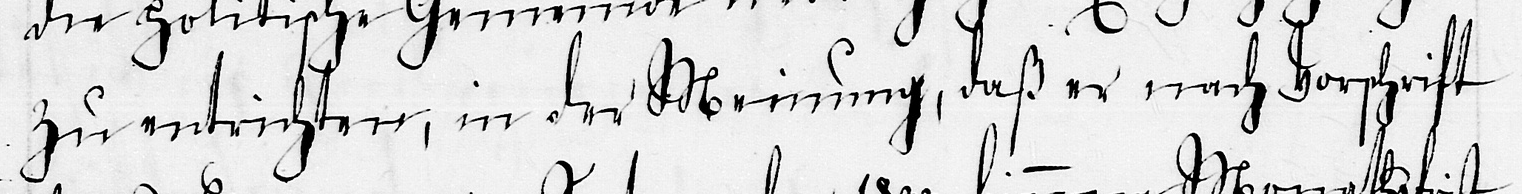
zu entrichten, in der Meinung, daß er nach Vorschrift
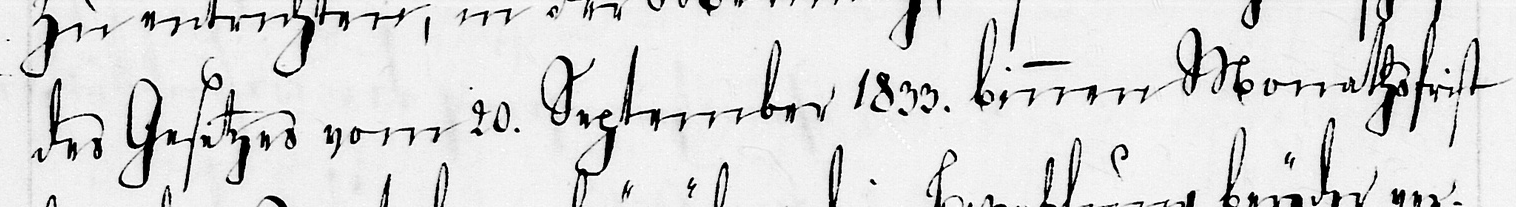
des Gesetzes vom 20. September 1833. binnen Monathsfrist
